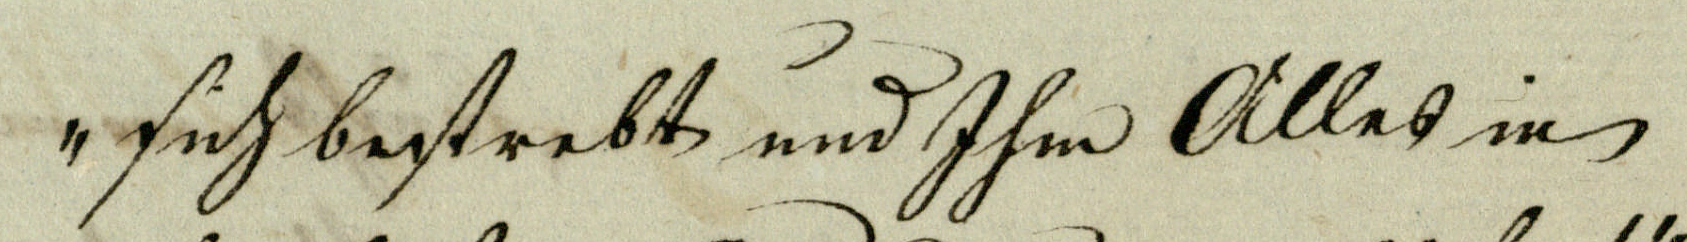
"sich bestrebt und Ihm Alles in
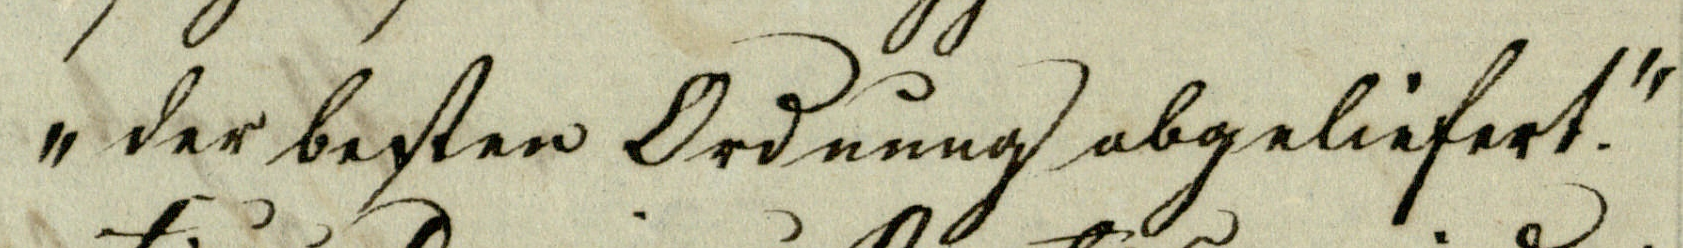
"der besten Ordnung abgeliefert."
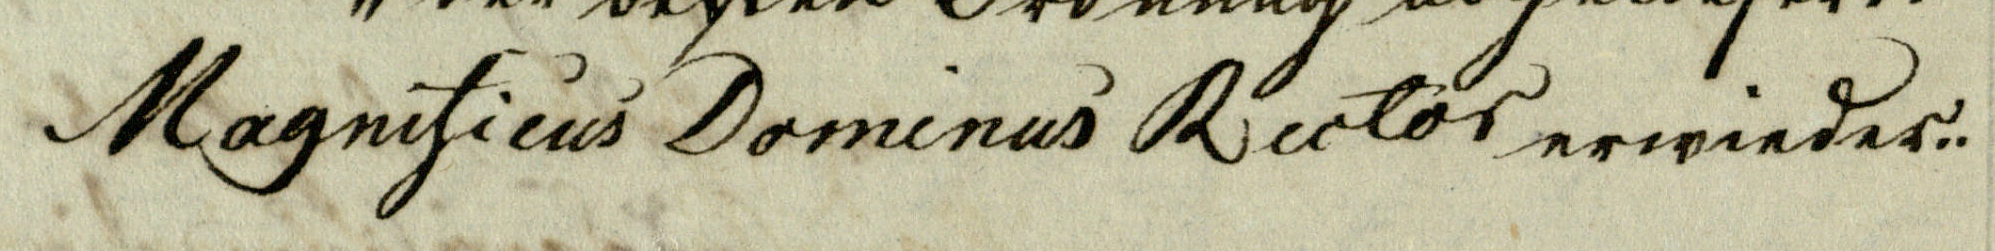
Magnificus Dominus Rector erwieder
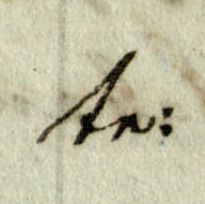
te:
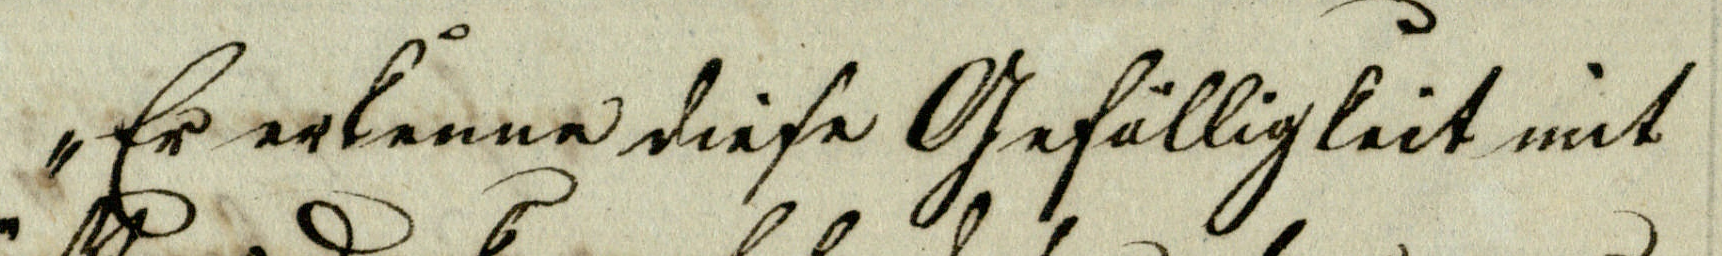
"Er erkennen diese Gefälligkeit mit
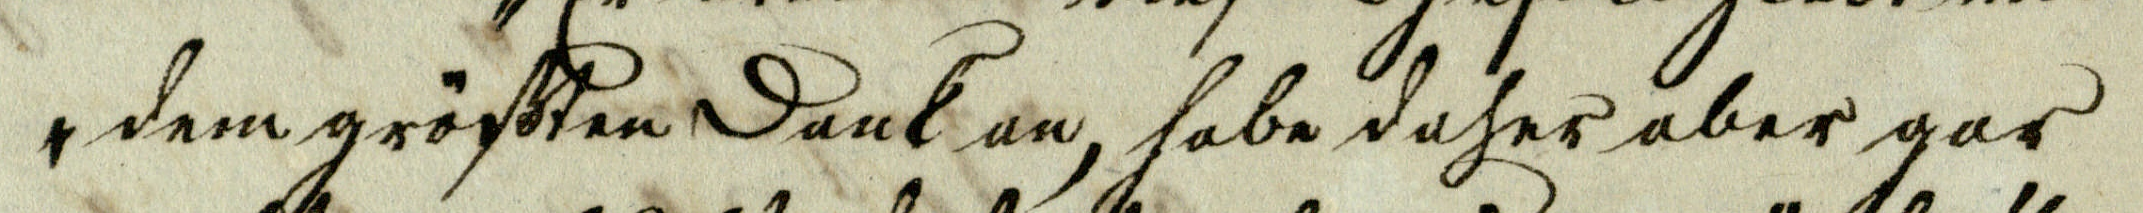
"dem größten Dank an, habe daher aber gar
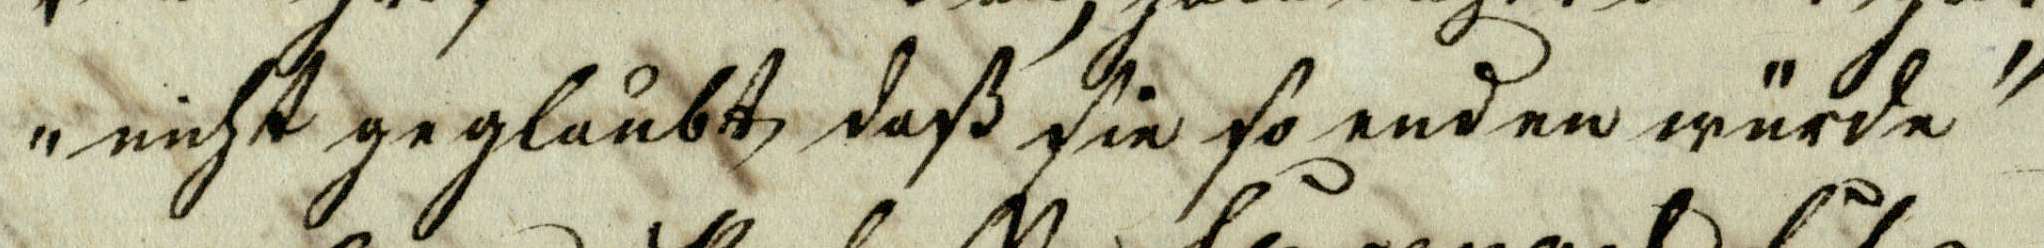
nicht geglaubt, daß sie so enden würde"
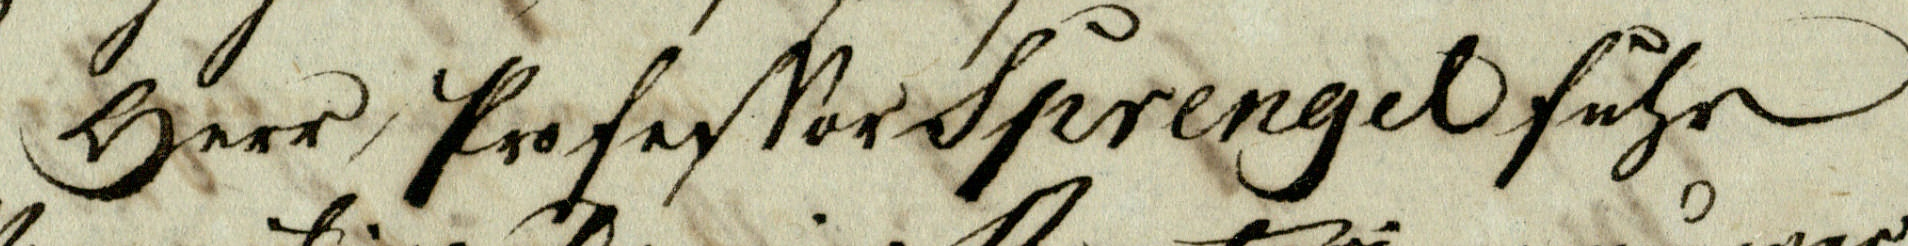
Herr Professor Sprengel fuhr
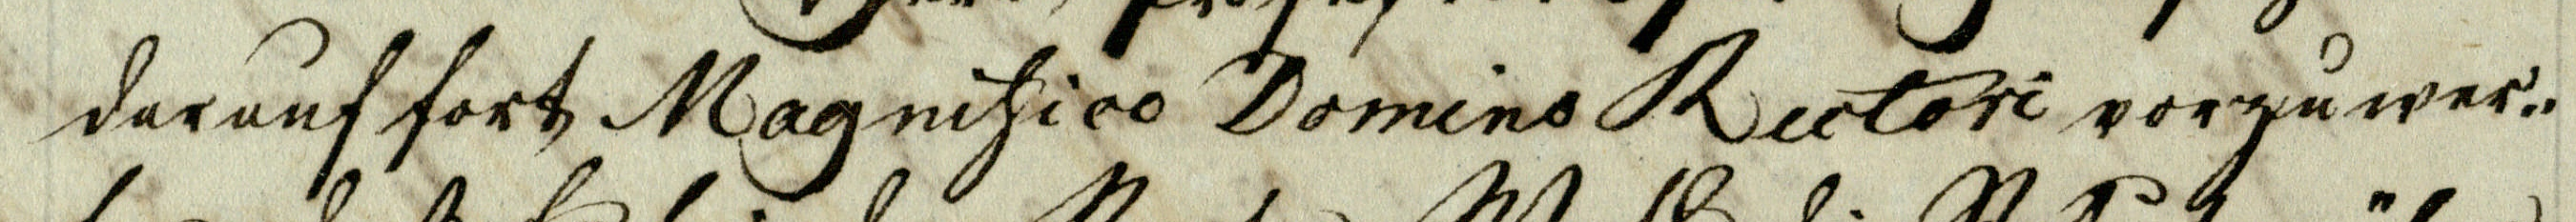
darauf fort Magnifico Domino Rectori vorzuwer¬
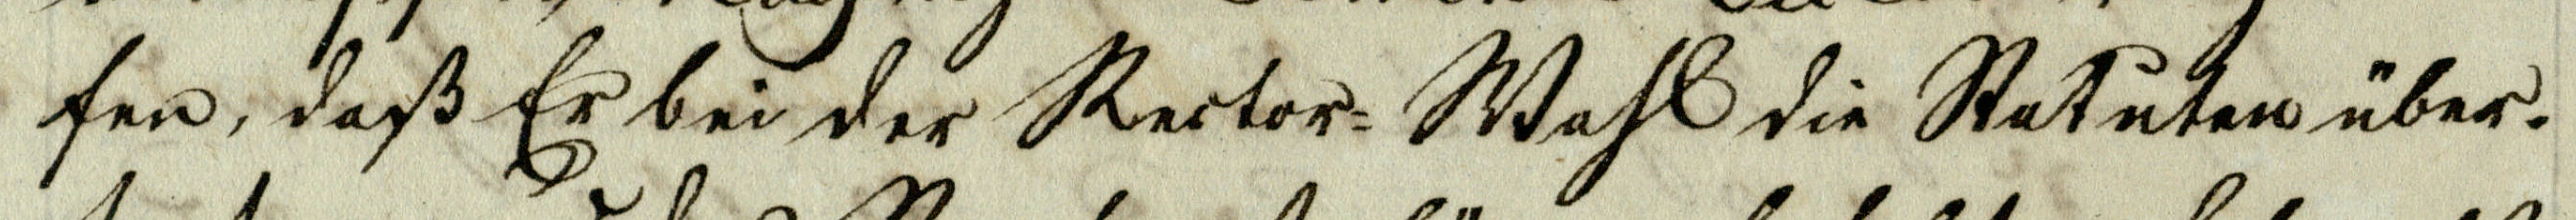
fen, daß Er bei der Rector-Wahl die Statuten über¬
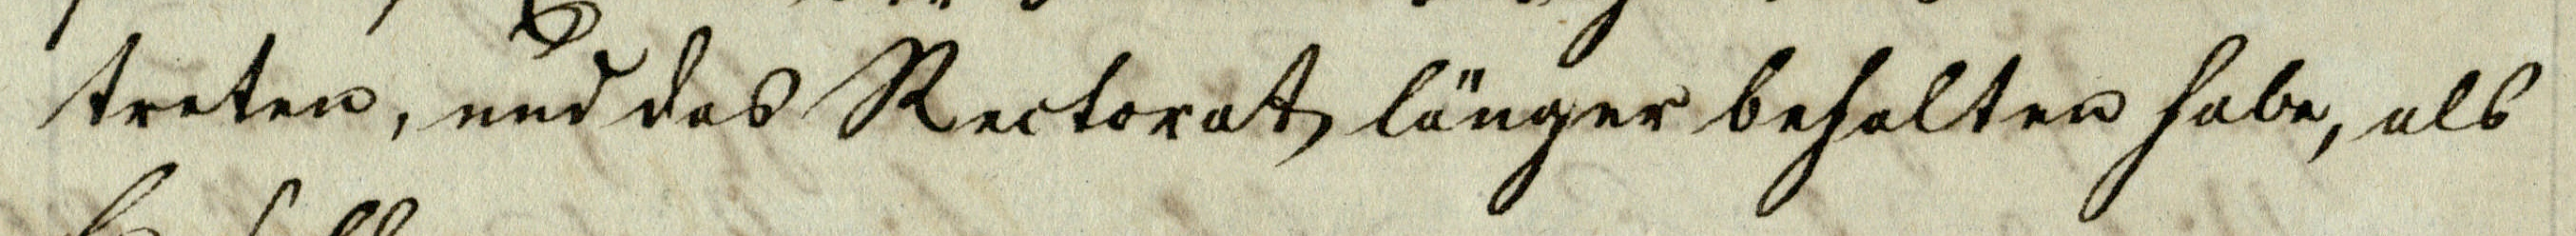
treten, und das Rectorat länger behalten habe, als
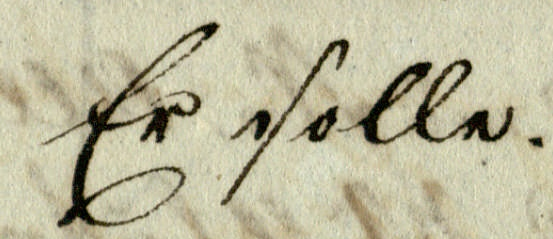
Er solle.
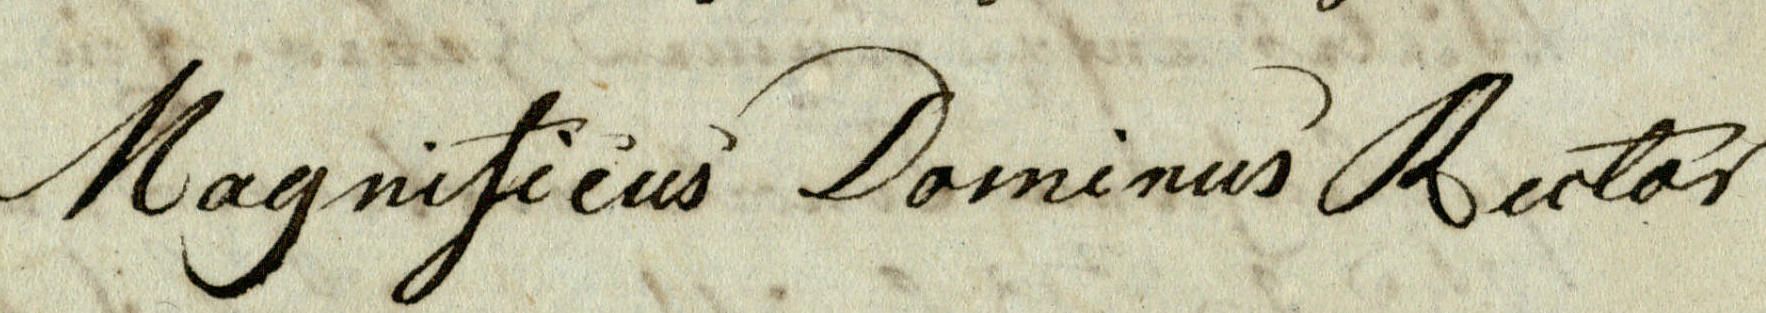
Magnificus Dominus Rector
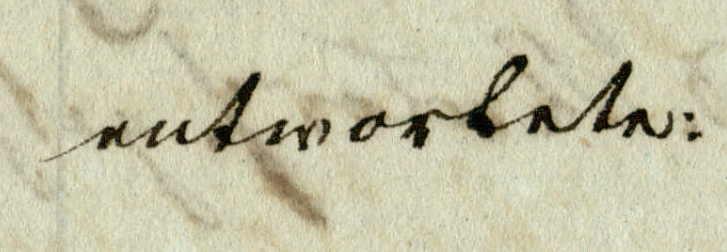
antwortete:
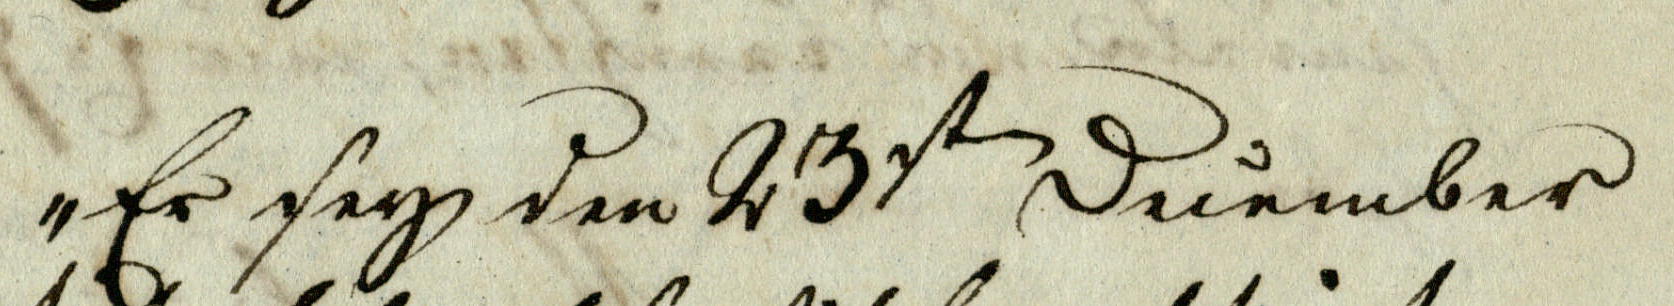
"Er sey den 23 ten December
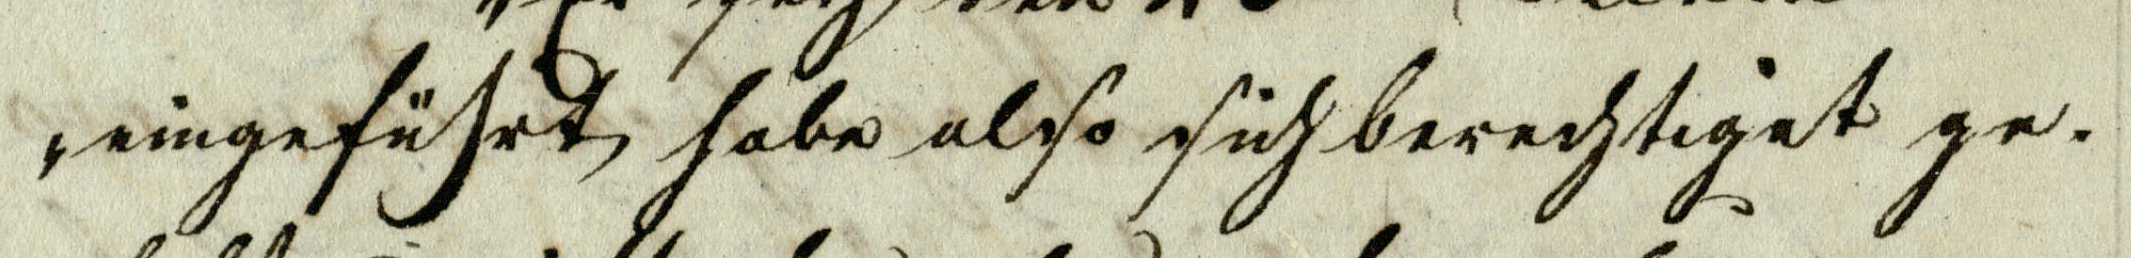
"eingeführt, habe also sich berechtiget ge¬
